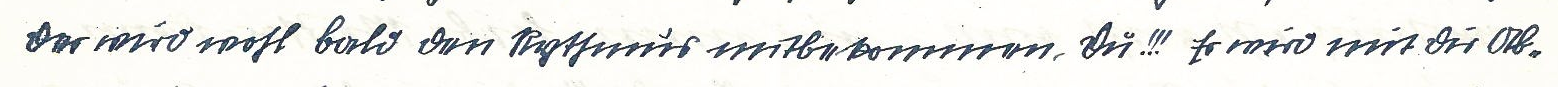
der wird wohl bald den Rhythmus mitbekommen, Du!!! Er wird mit Dir Ab¬
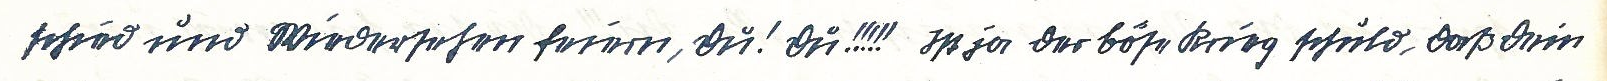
schied und Wiedersehen feiern, Du! Du!!!!! Ist ja der böse Krieg schuld, daß Dein
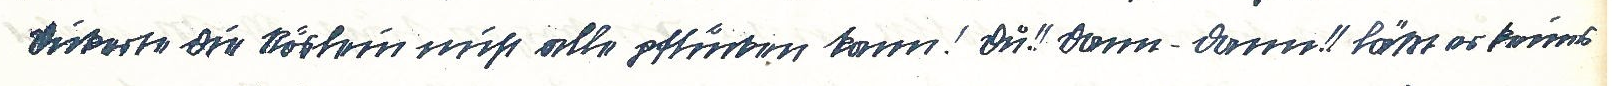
Dickerle die Röslein nicht alle pflücken kann! Du!! Dann – dann!! läßt er keines
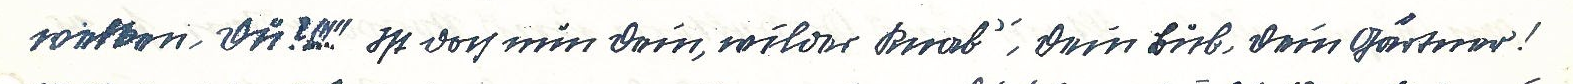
welken, Du?!!!!! Ist doch nun Dein wilder Knab‘, Dein Bub, Dein Gärtner!
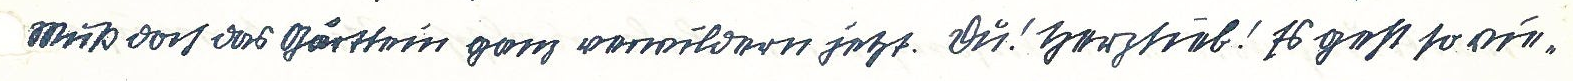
Muß doch das Gärtlein ganz verwildern jetzt. Du! Herzlieb! Es geht so vie¬
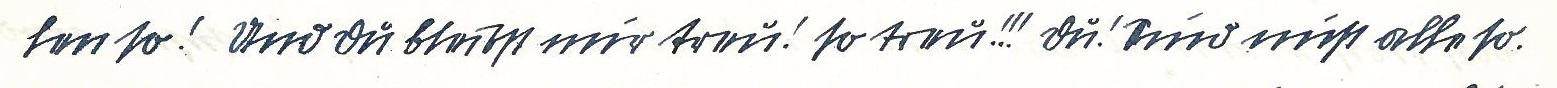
len so! Und Du bleibst mir treu! so treu!!! Du! Sind nicht alle so.
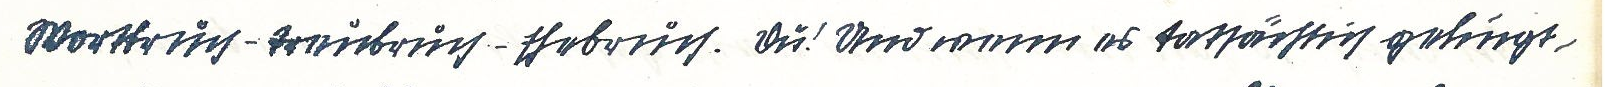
Wortbruch – Treubruch – Ehebruch. Du! Und wenn es tatsächlich gelingt,
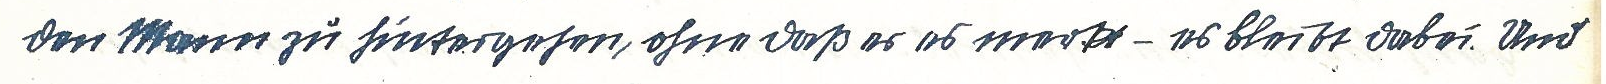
den Mann zu hintergehen, ohne daß er es merkt, – es bleibt dabei. Und
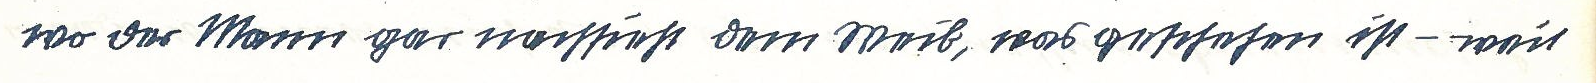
wenn der Mann gar nachsieht dem Weib, was geschehen ist – weil er viel¬
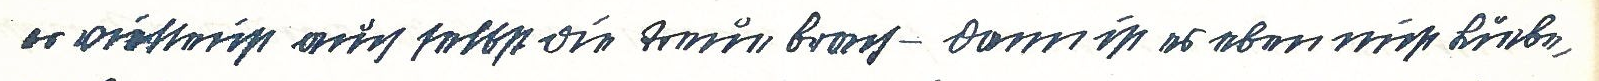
leicht auch selbst die Treue brach – dann ist es eben nicht Liebe,
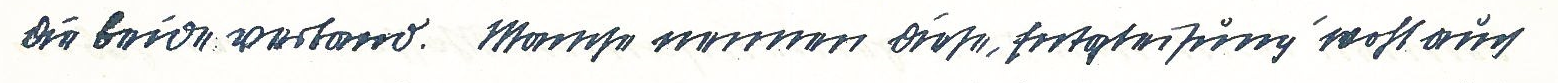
die beide verband. Manche nennen diese „Entgleisung“ wohl auch
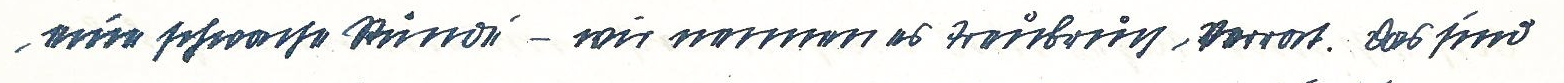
„eine schwache Stunde“ – wir nennen es Treubruch, Verrat. Das sind
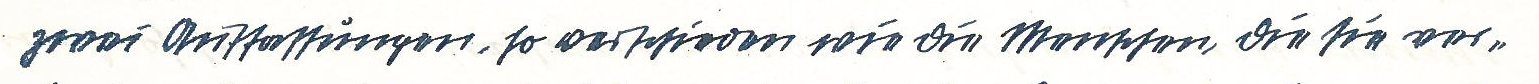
zwei Auffassungen, so verschieden, wie die Menschen, die sie ver¬
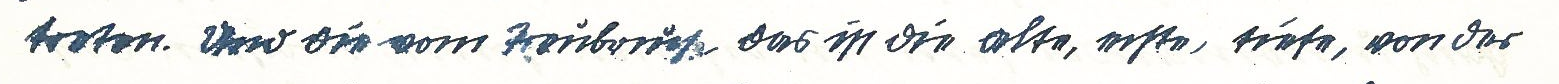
treten. Und die vom Treubruch, das ist die alte, echte, tiefe, von der
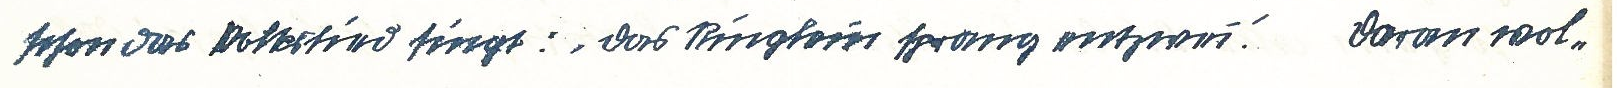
schon das Volkslied singt: „das Ringlein sprang entzwei“. Daran wol¬
